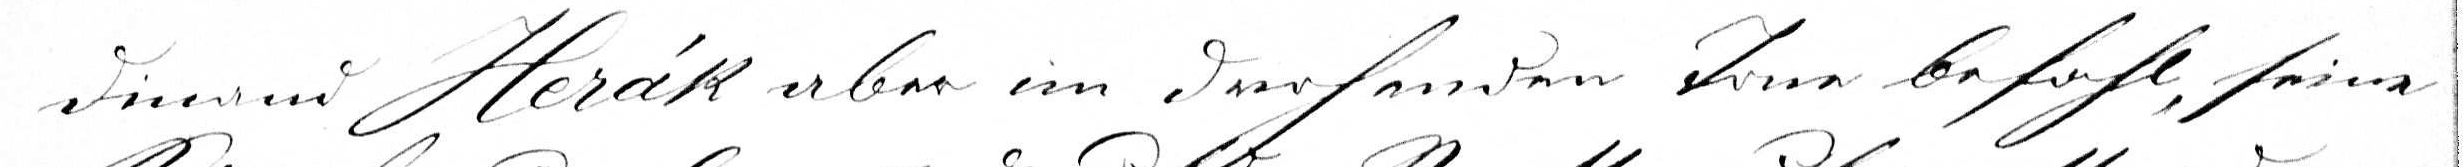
dinand Herák aber im drohenden Tone befahl, seine
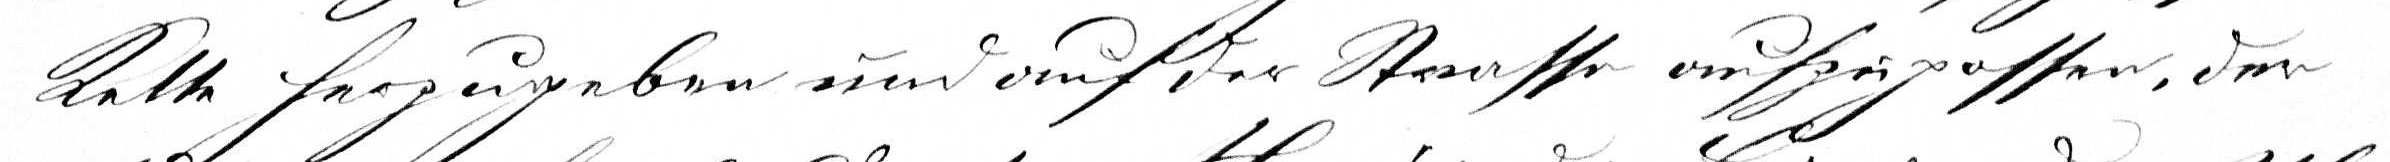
Kette herzugeben und auf der Strasse aufzupassen, der
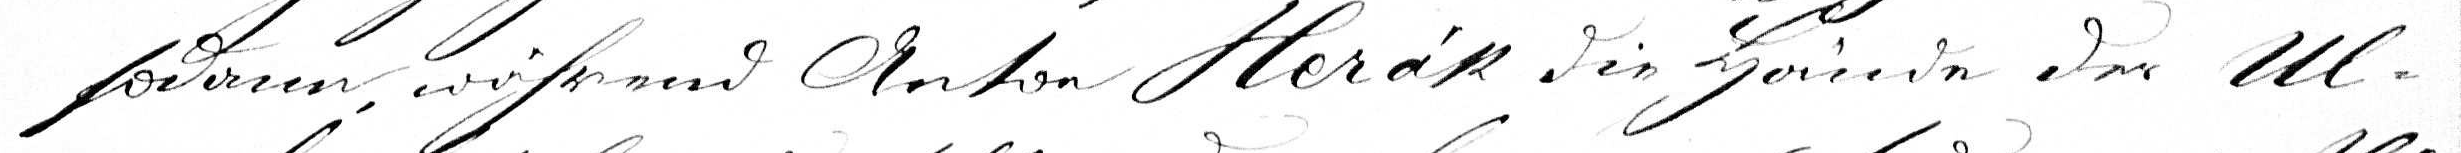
sodann, während Anton Herák die Hände der Ul¬
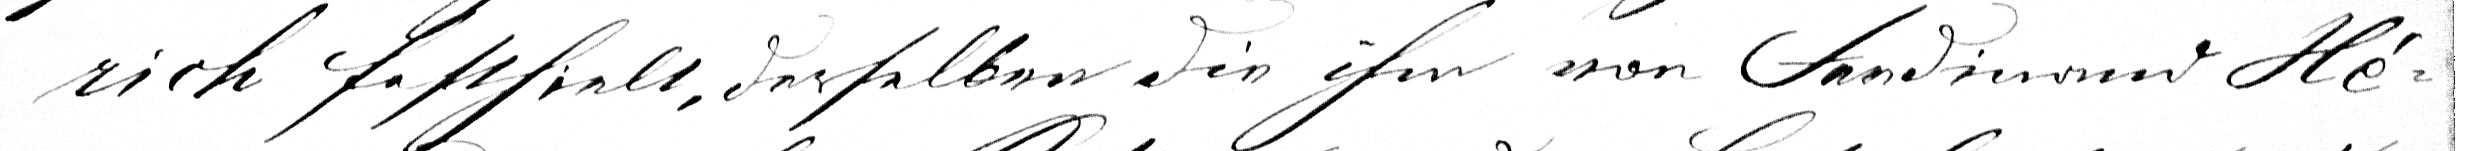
rich festhielt, derselben die ihm von Ferdinand Hé¬
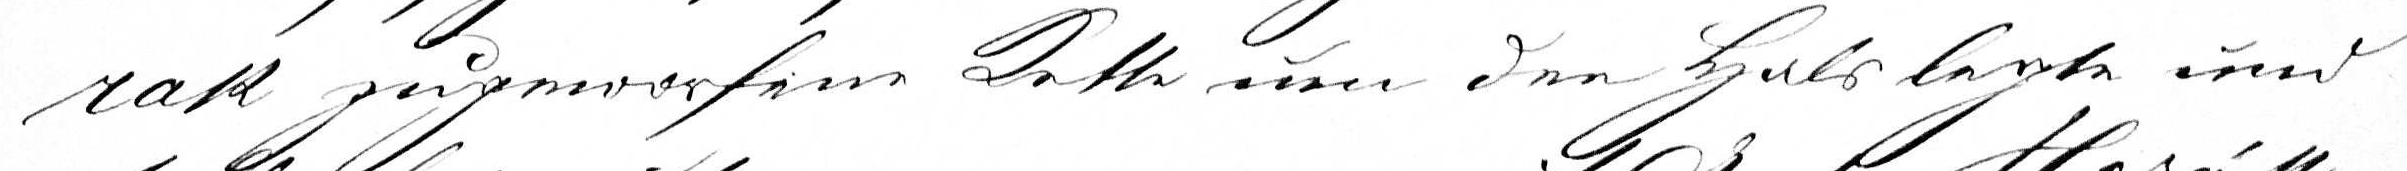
rak [sic] zugeworfene Kette um den Hals legte und
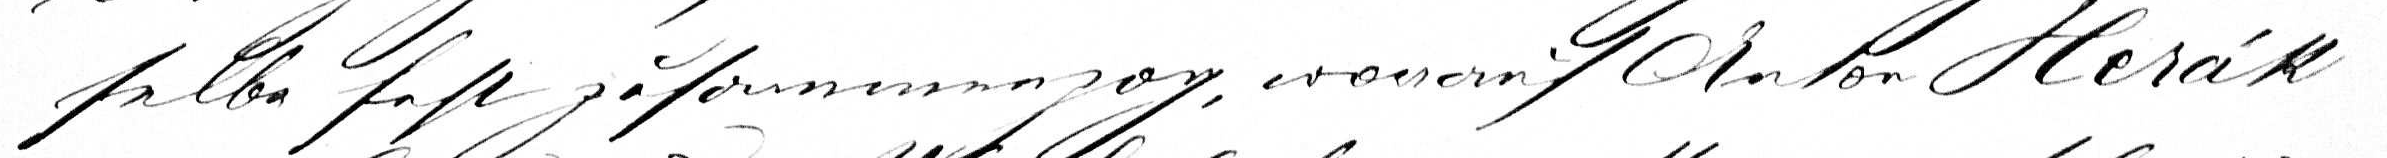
selbe fest zusammenzog, worauf Anton Herák
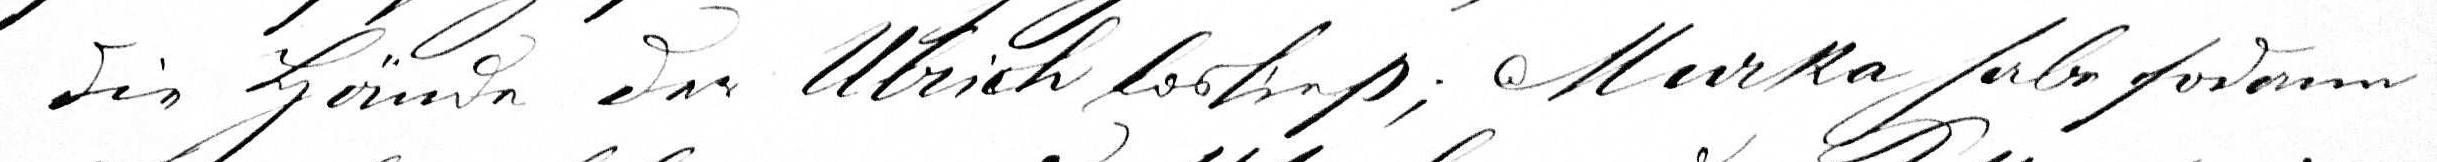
die Hände der Ulrich losließ; Murka habe sodann
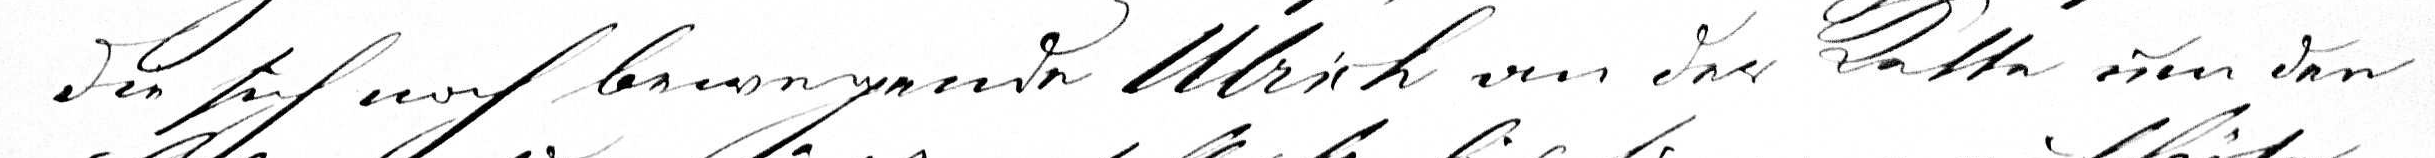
die sich noch bewegende Ulrich an der Kette um den
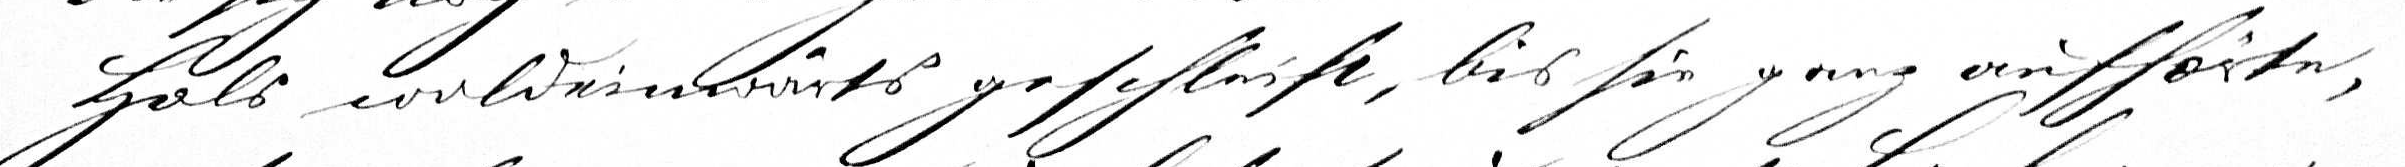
Hals waldeinwärts geschleift, bis sie ganz aufhörte,
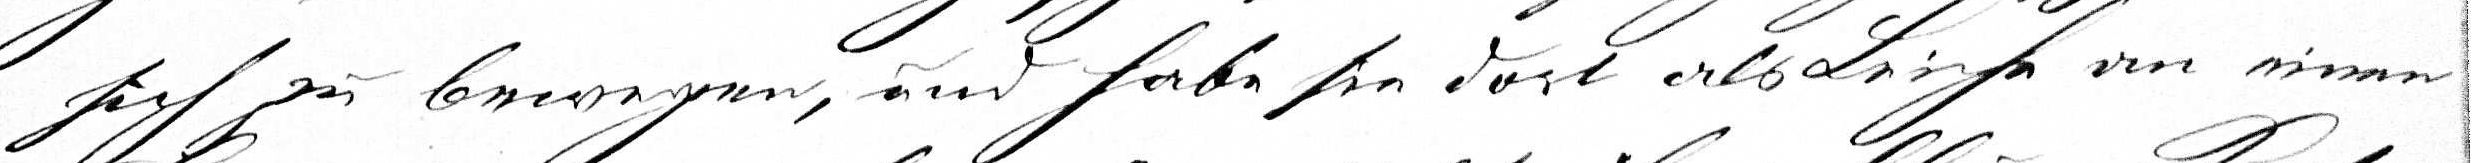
sich zu bewegen, und habe sie dort als Leiche an einen
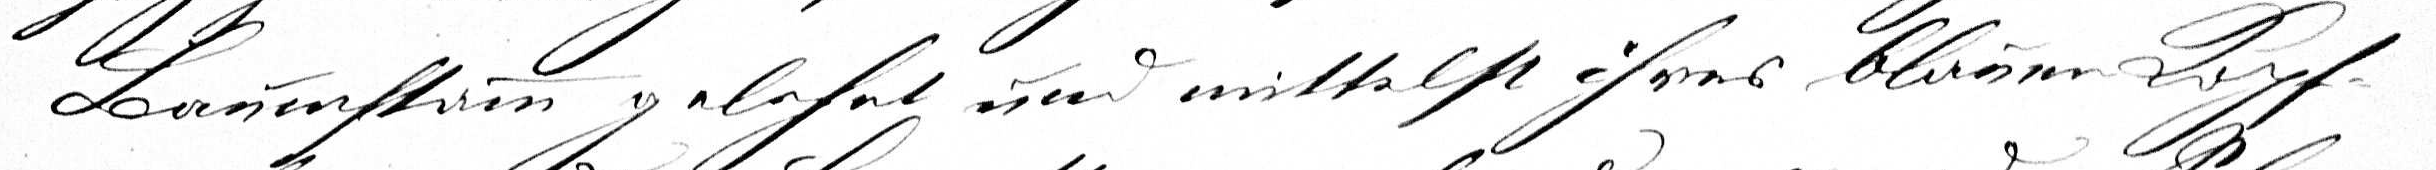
Baumstamm gelehnt und mittelst ihres blauen Kopf¬
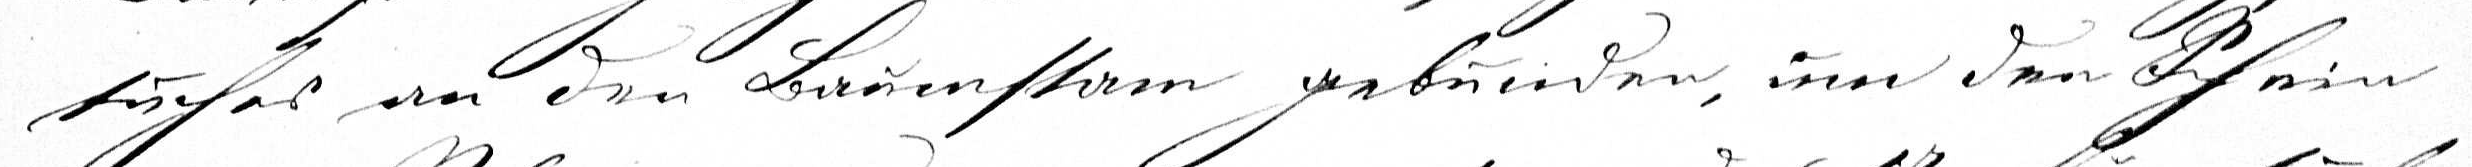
tuchen an den Baumstamm gebunden, um den Schein
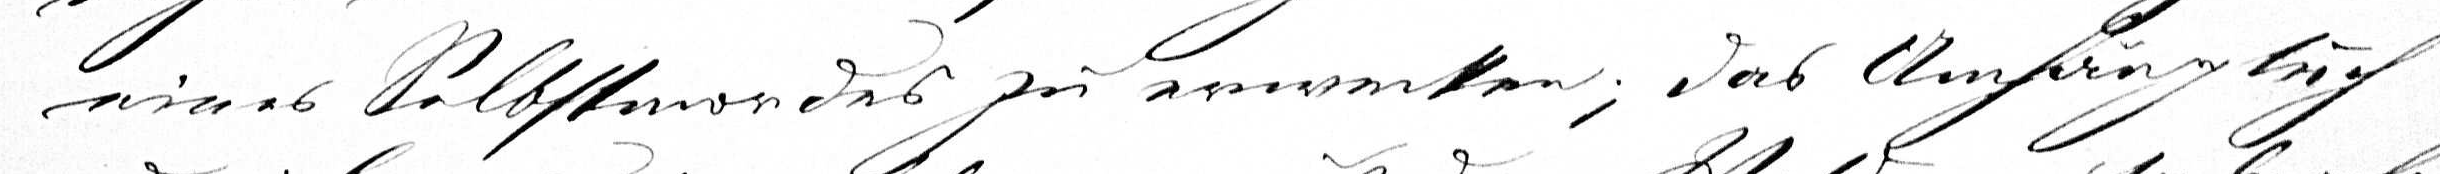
eines Selbstmordes zu erwecken; das Umhangtuch
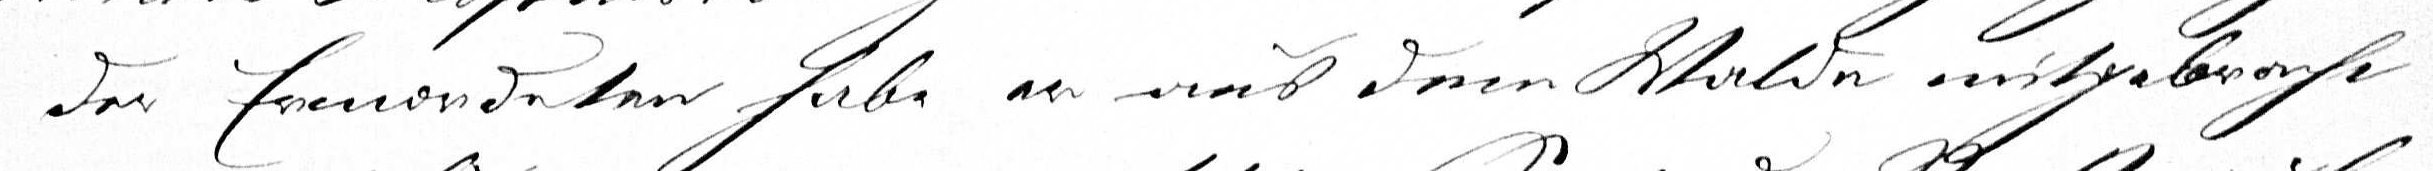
der Ermordeten habe er aus dem Walde mitgebracht
